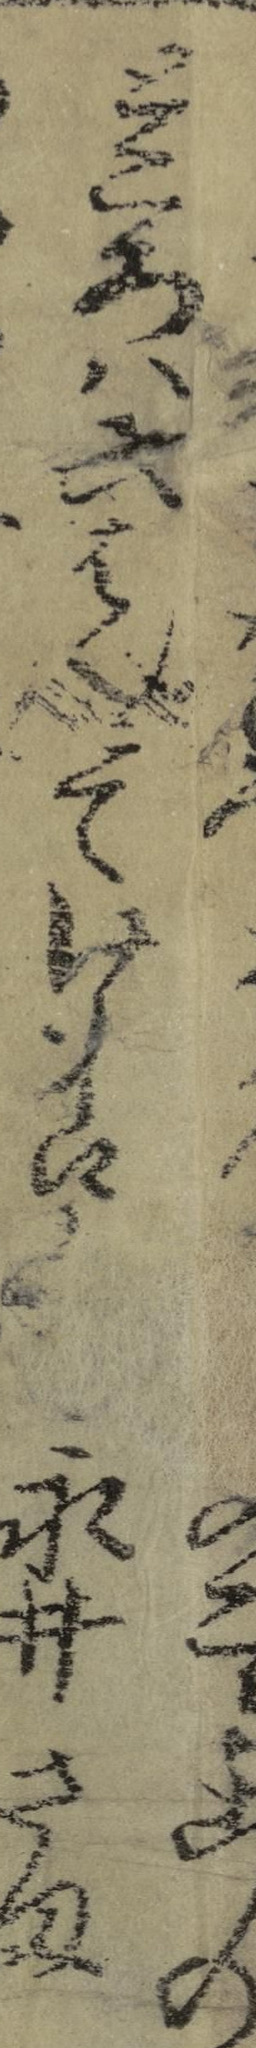ところは六はんにてけし口永井さま
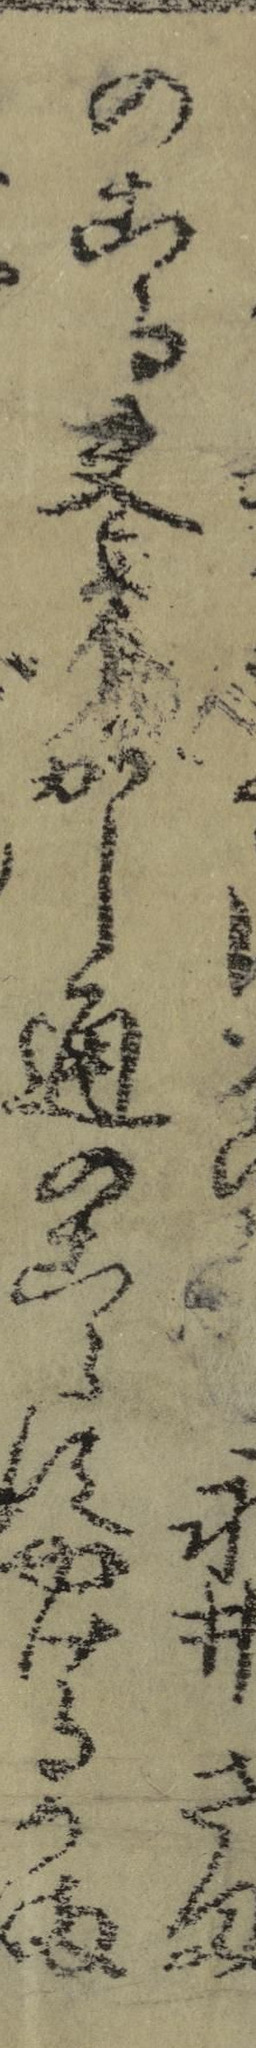のこる夫よりかし通のこらすやけるかま
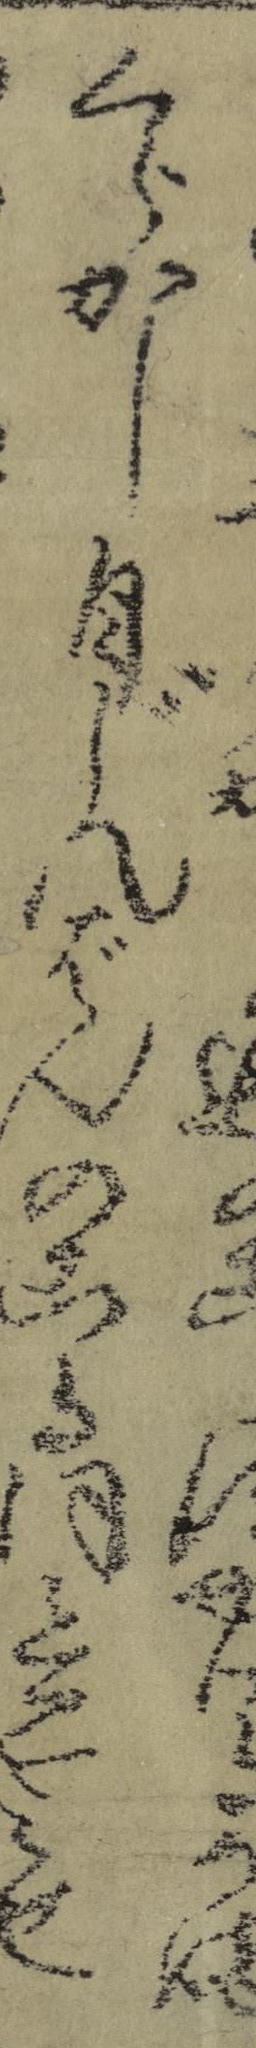くらかし自しんばんのこる同とこみせ
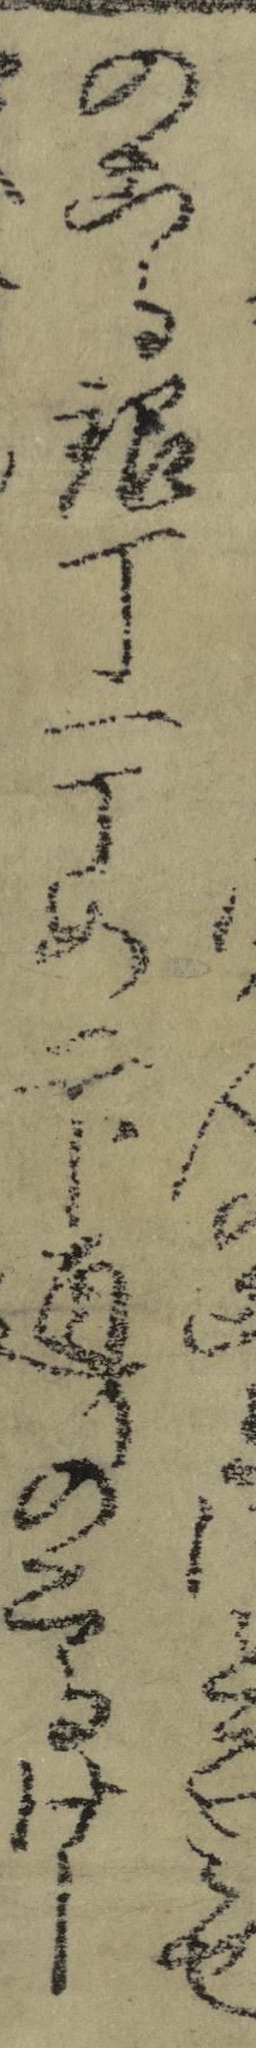のこる銀丁一丁め二分通りのこるけし
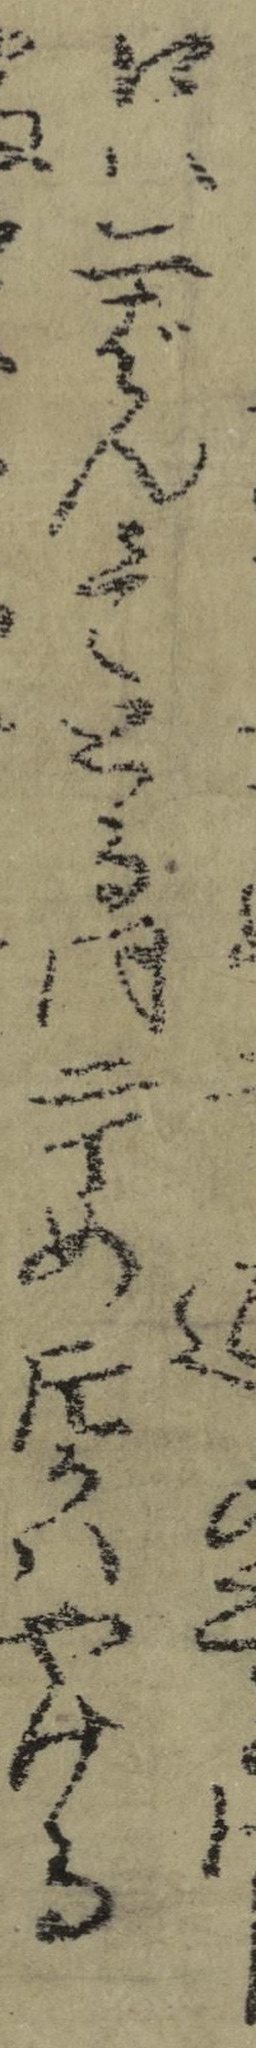口は二ばんにてとる同二丁め片かはやける
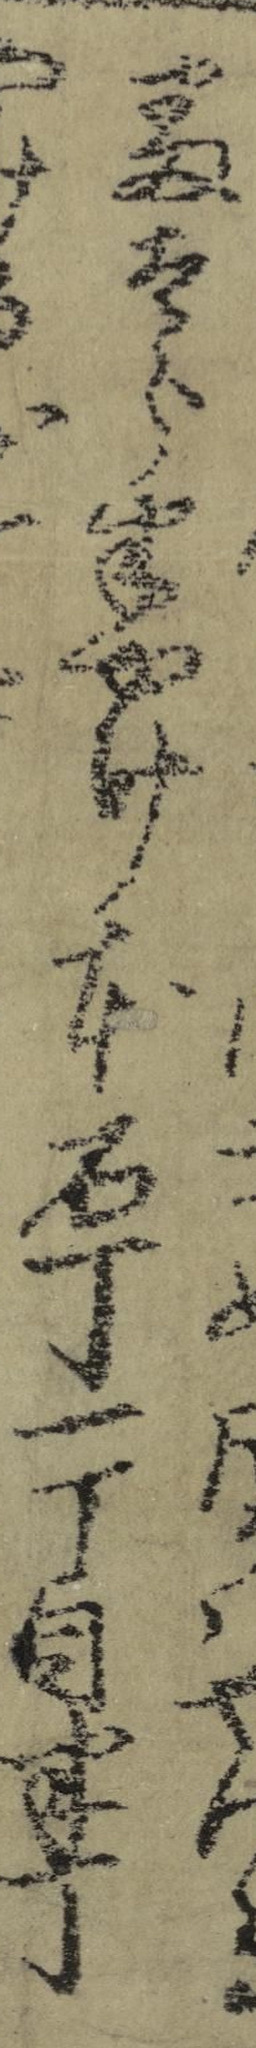富はら半やけ本石丁一丁目半丁
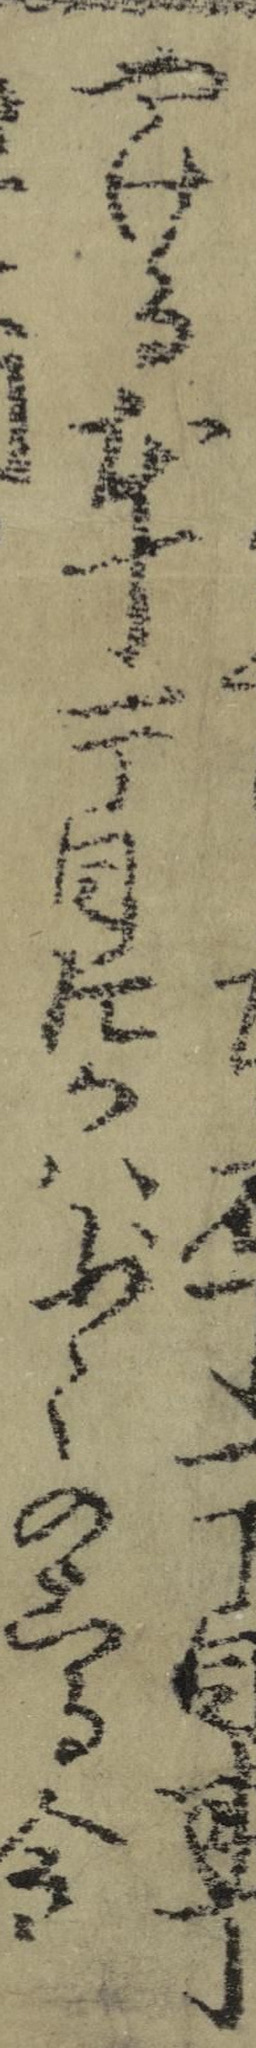やける本丁一丁目片かは少〻のこる金
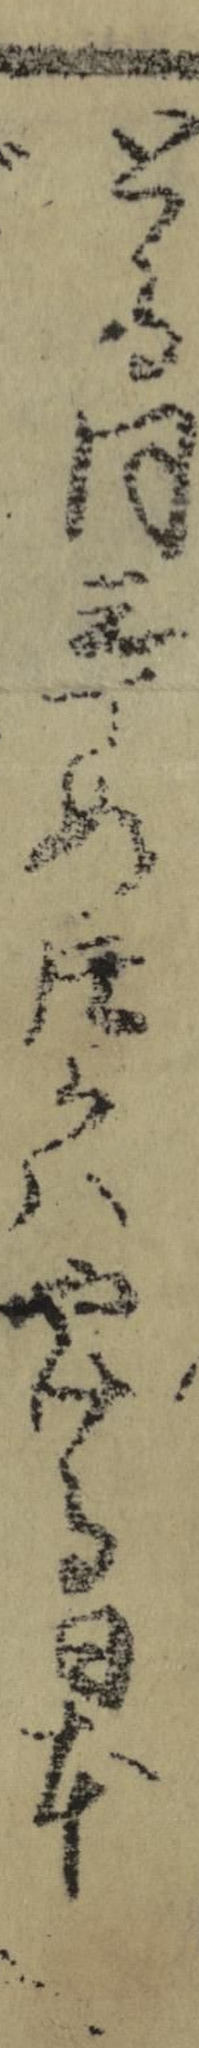とる同三丁め片かはやける日本
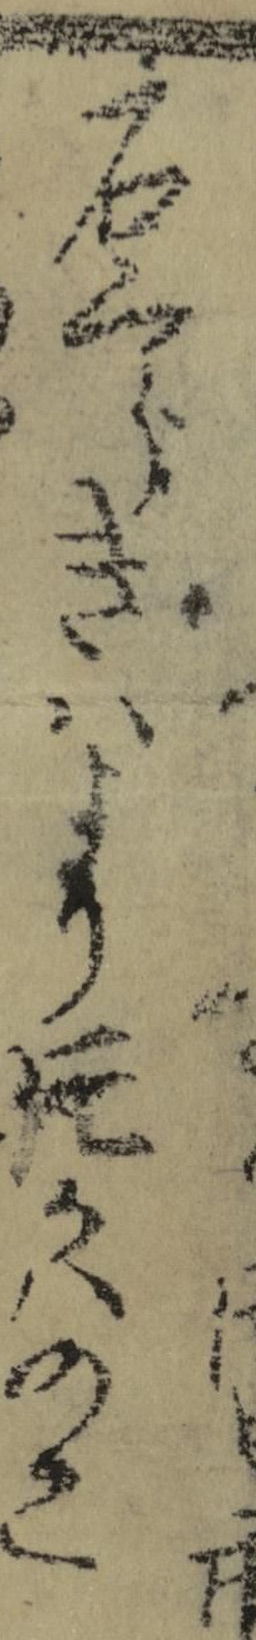石くらきはより片かはのこ
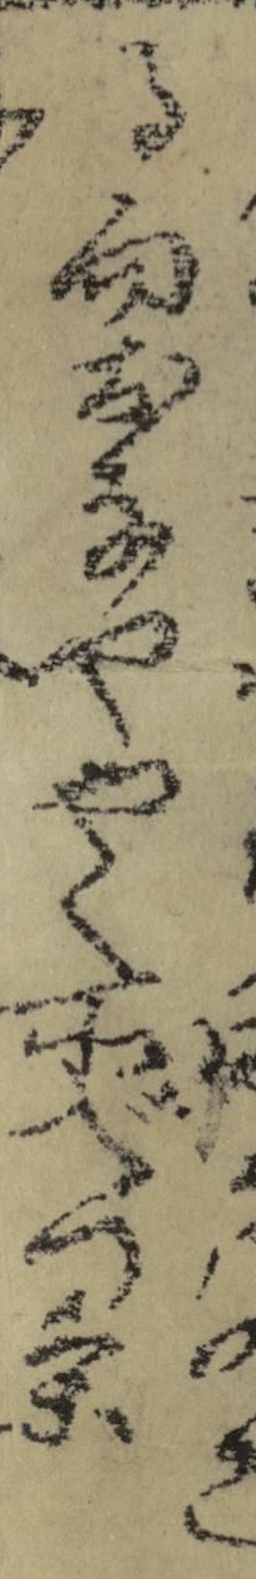る向おゝみややく所べつ条
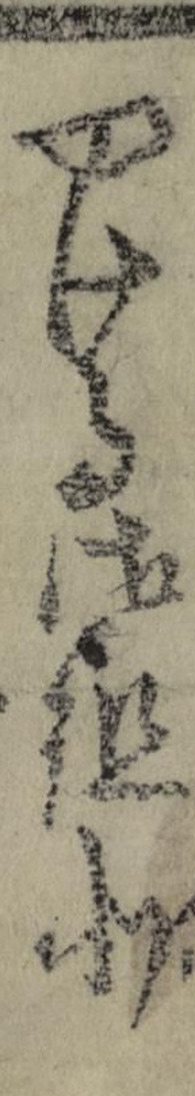やける御組北
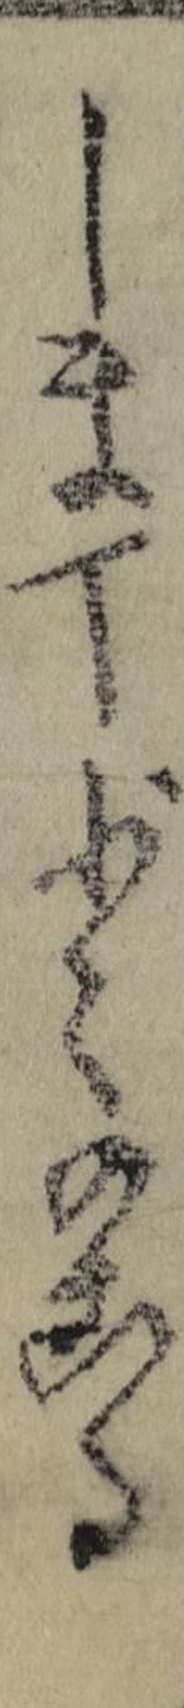しま丁少〻のこる
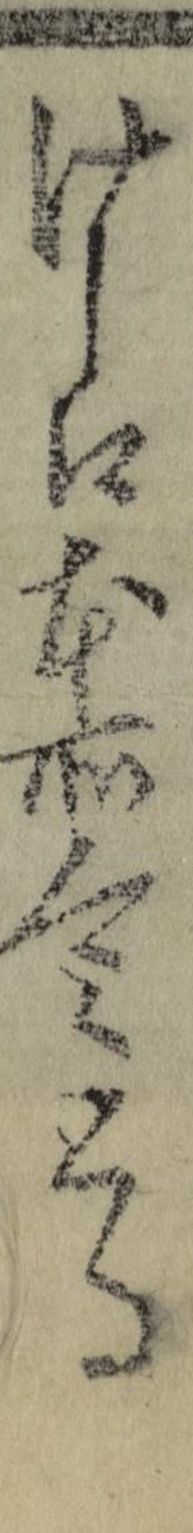けし口本所くみとる
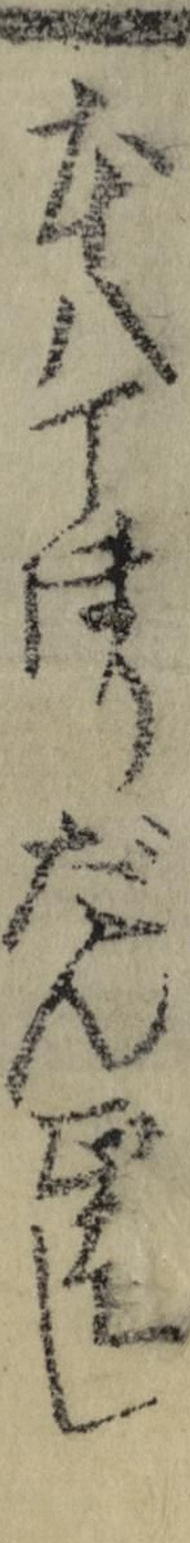本八丁ほりだん正はし
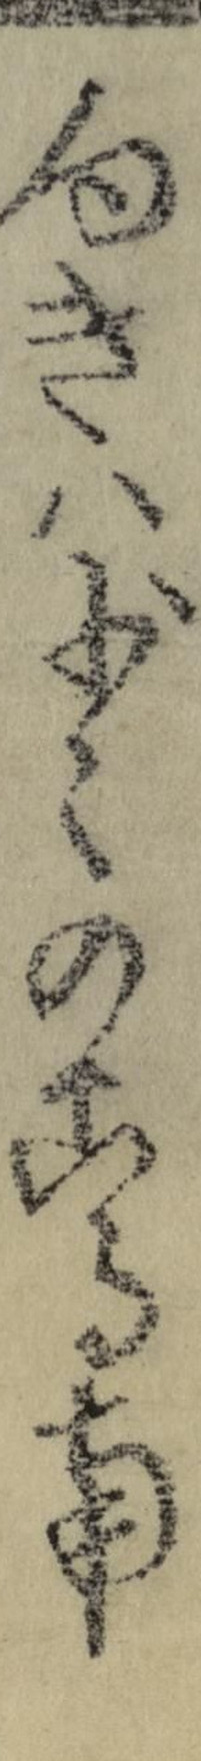向きは少〻のこる南
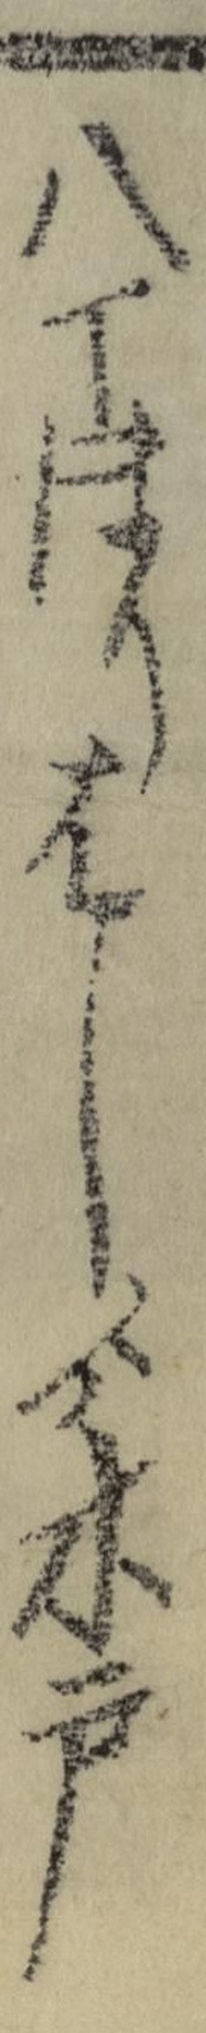八丁ほりはしゟ木戸
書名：[慶応二年十一月の江戸大火に関する瓦版]
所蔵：東京大学地震研究所図書室 Earthquake Research Institute Library, The University of Tokyo, JAPAN
